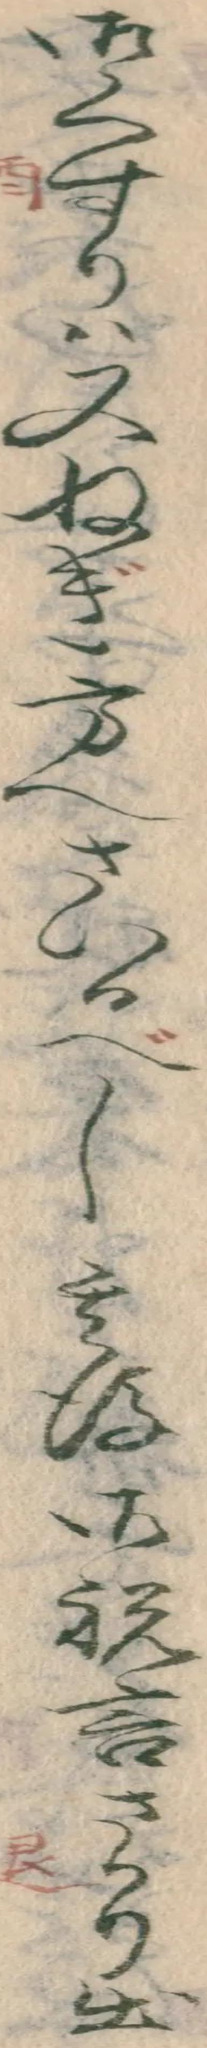御くすりは又ねぎ方へまいるべし其後御祝言さかり出
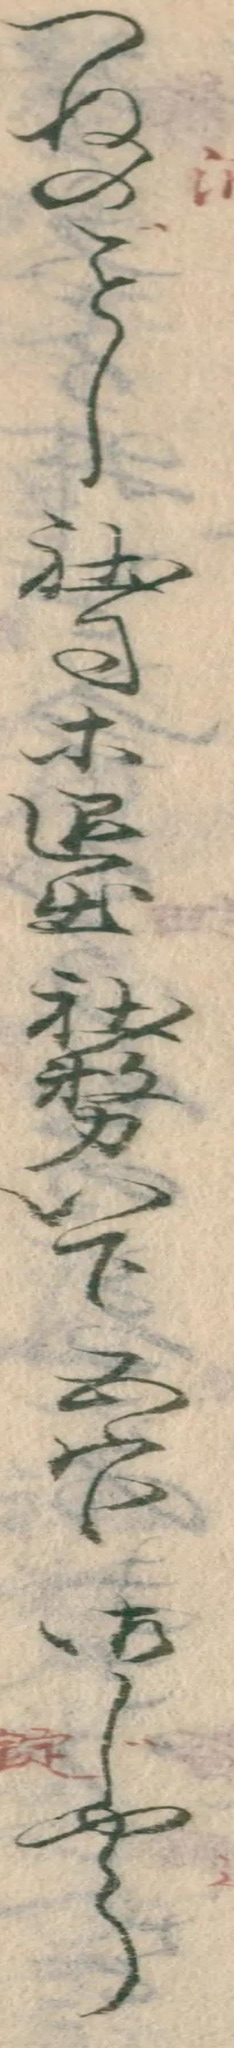つねのごとし社司等退出社務い下五官御じやう
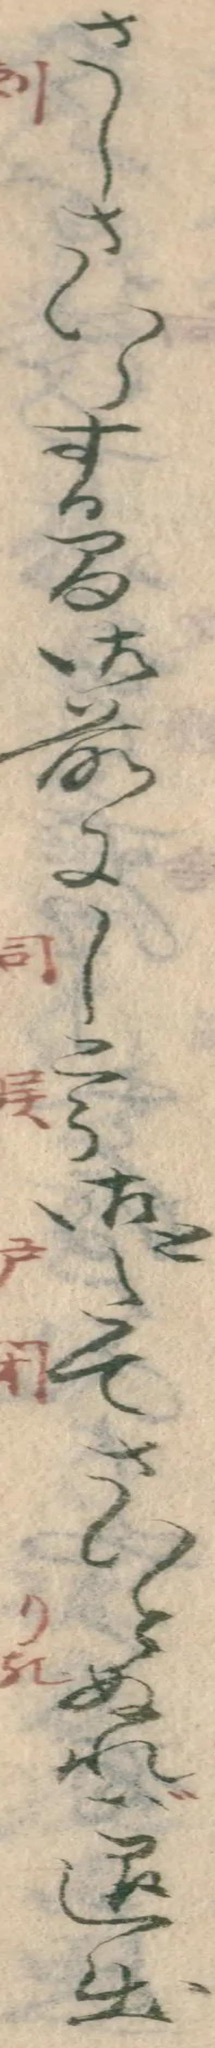さしまいらする間御前にしこう御とたてまいとぬれば退出
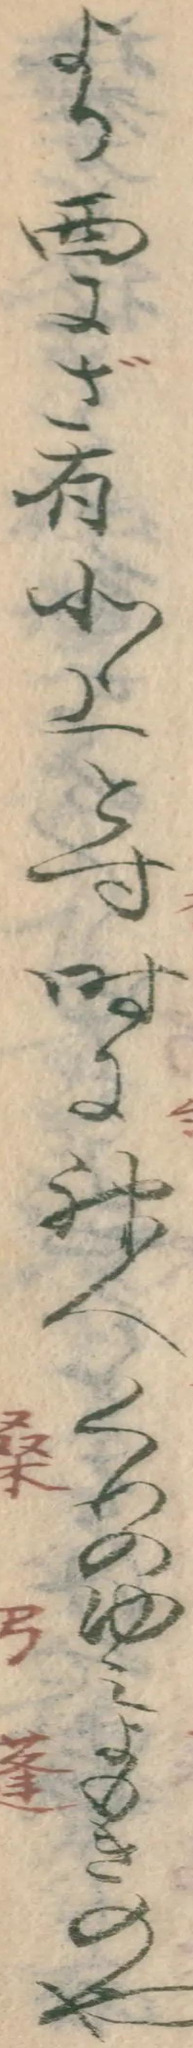より西にざ有北上とす時に神人くわのゆみよもきのや

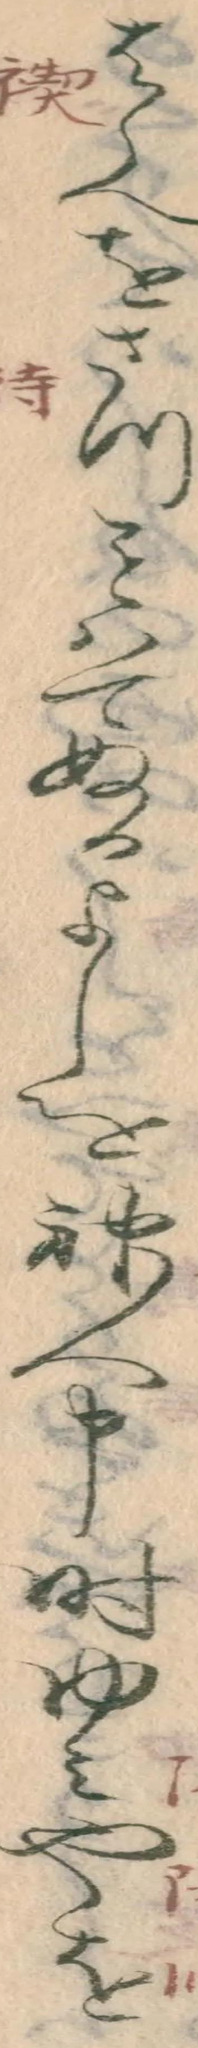はらへをまつことはてぬるよしを神人申時ゆみやを
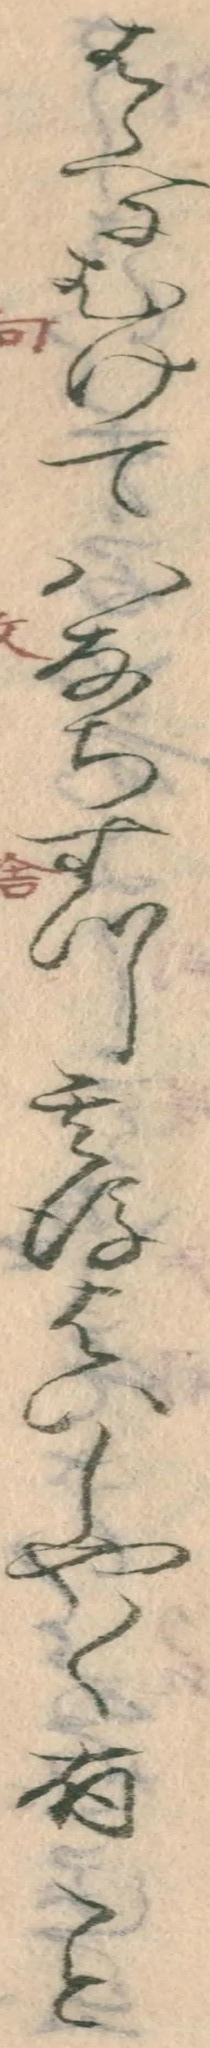はらへにむけてはなちすつ其後はいしやく有こと
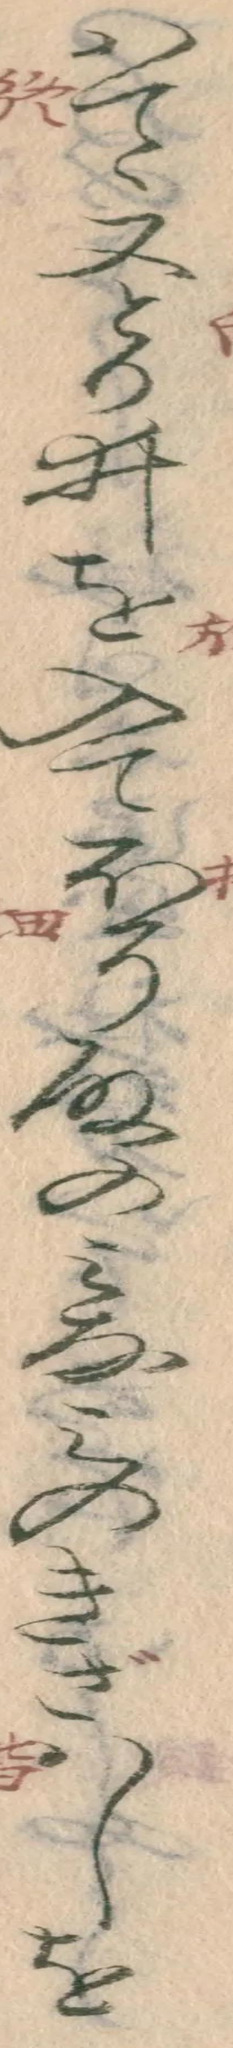はてゝ又とりゐを入てほそ殿のみなみのきざはしを
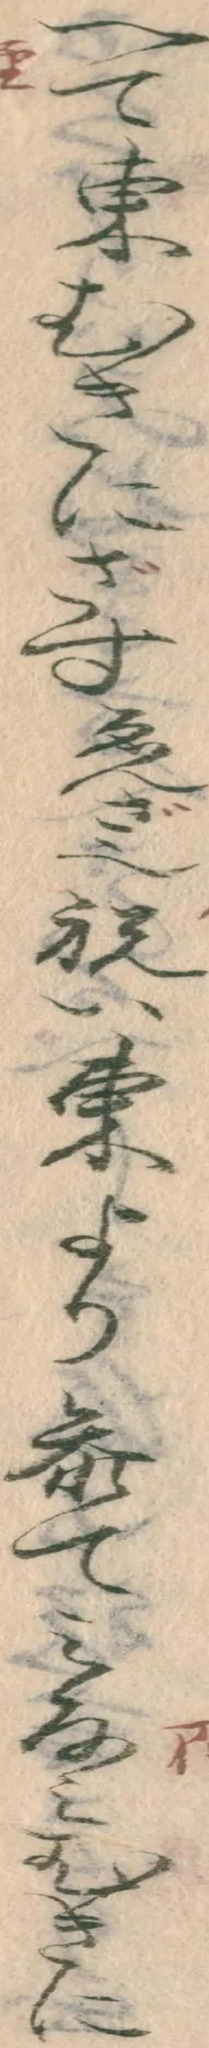へて東むきにざすゑんざ也祝は東より参てみなみむきに
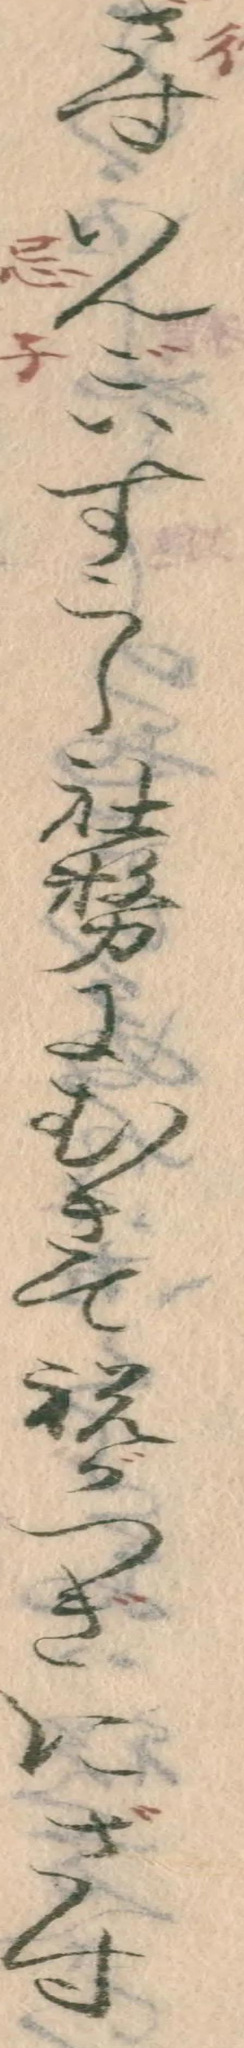ざすいんごはすこし社務にむきて祝がつぎにざす
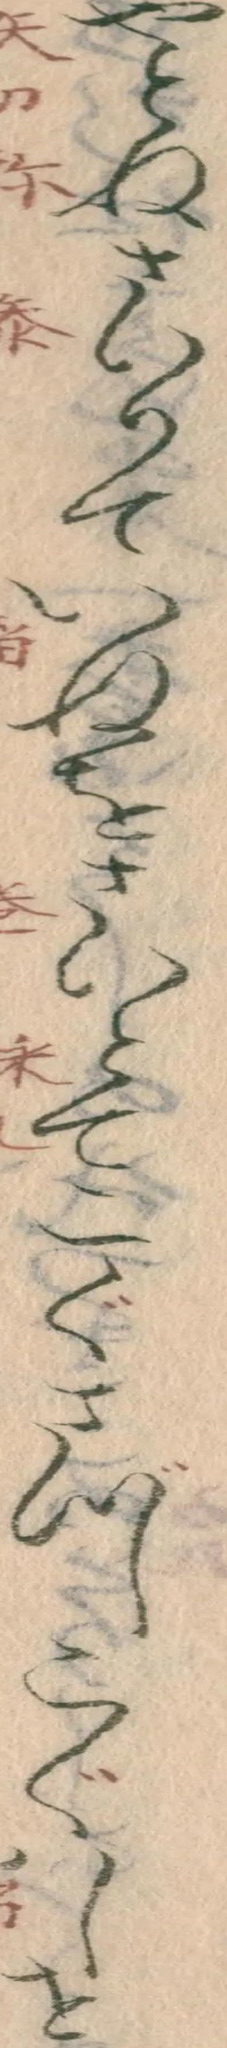やとねまいりていねをまいとてこぐまづこぐはしを
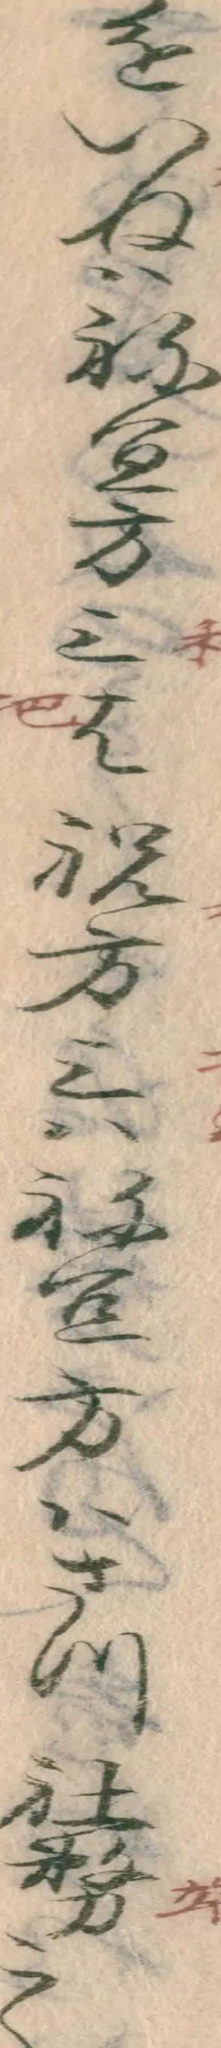進いねは祢宜方三は祝方三は祢宜方はまつ社務こく
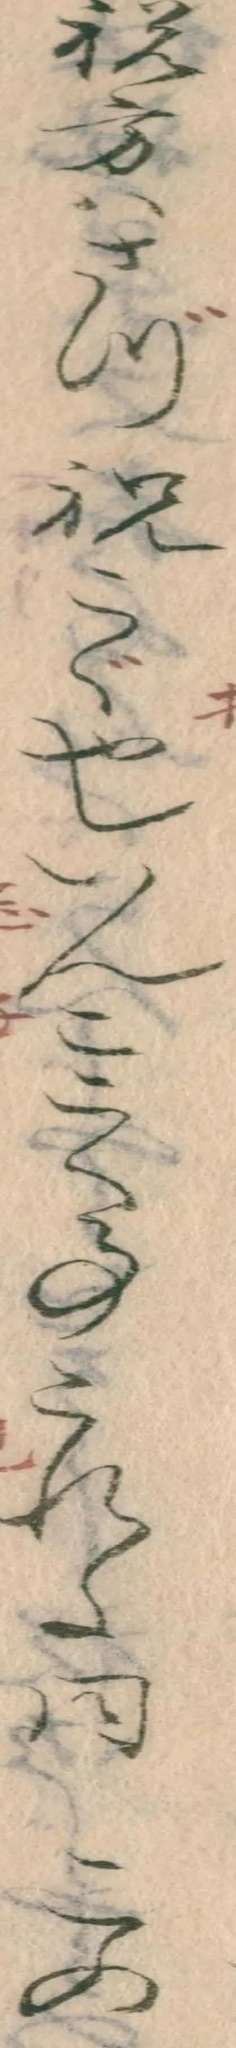祝方はまづ祝こぐ也いんここく事これに同この
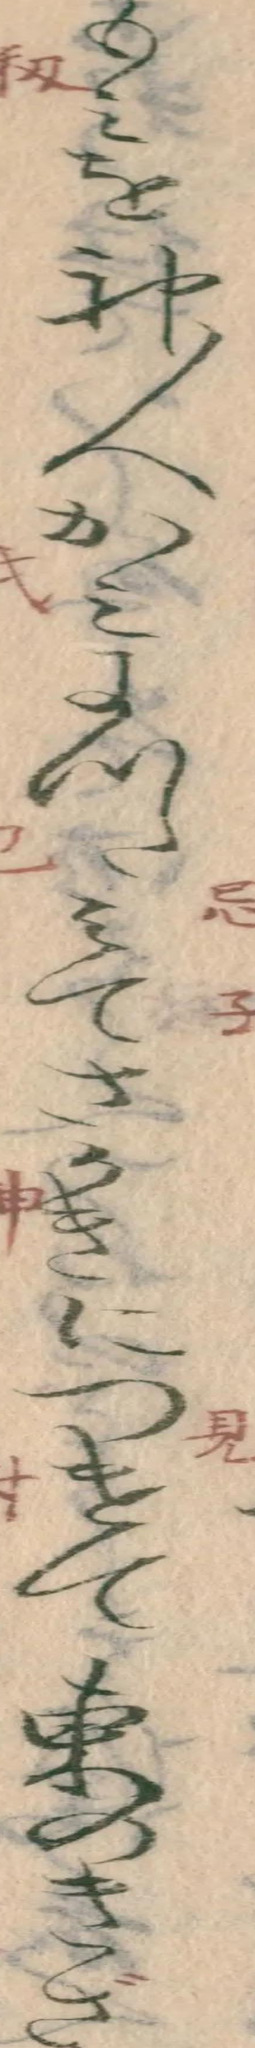もみを神人かみにつゝみてさかきにつけて東のきざ
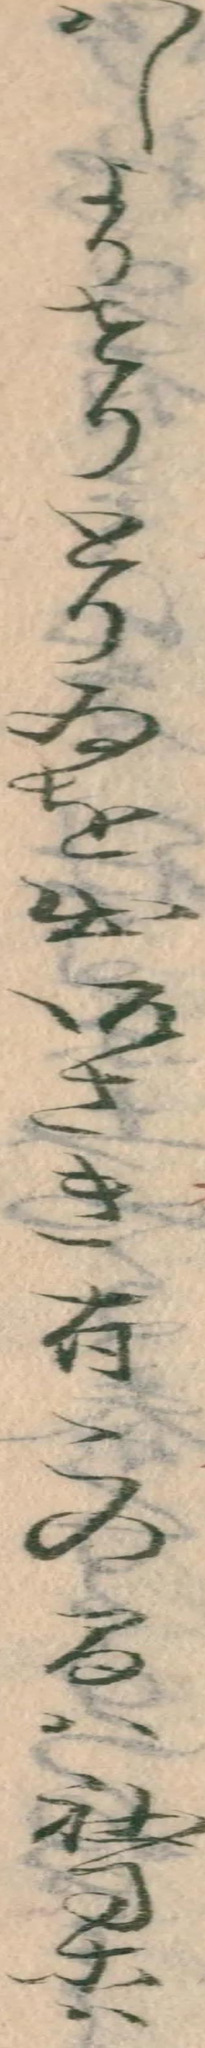はしよりをりとりゐを出御さき有この間は社司等は
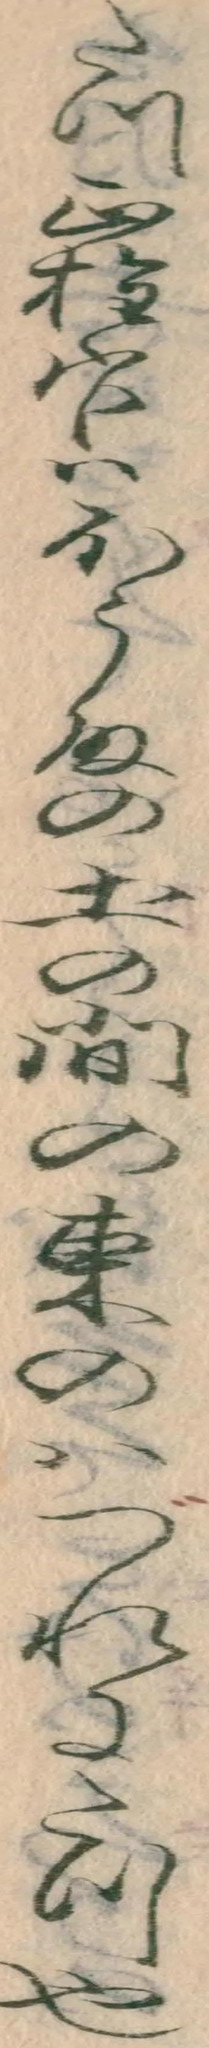たつ正権官はほそ殿の土の間の東のはづれにたつ也
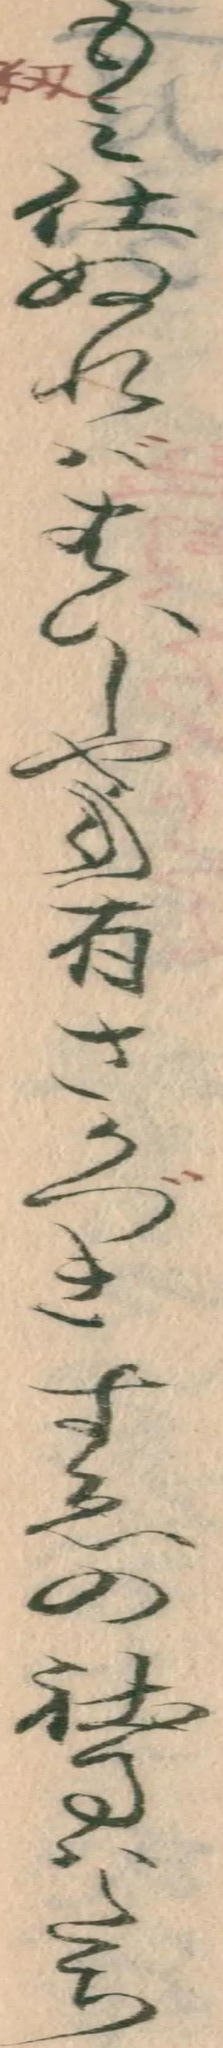もみ仕ぬればはいしやく有さかづきすゑの社司はたち
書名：賀茂社記録. 第3冊
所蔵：国立国会図書館 National Diet Library, JAPAN
